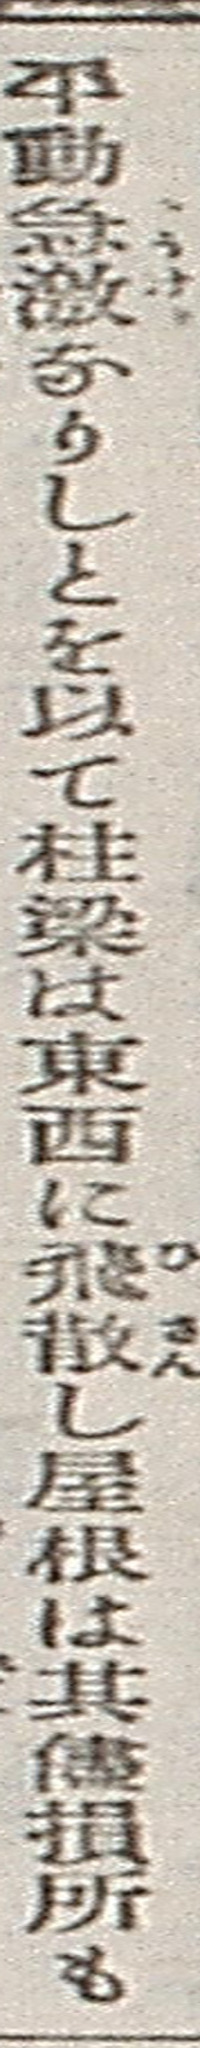平動急激なりしとを以て柱梁は東西に飛散し屋根は其侭損所も
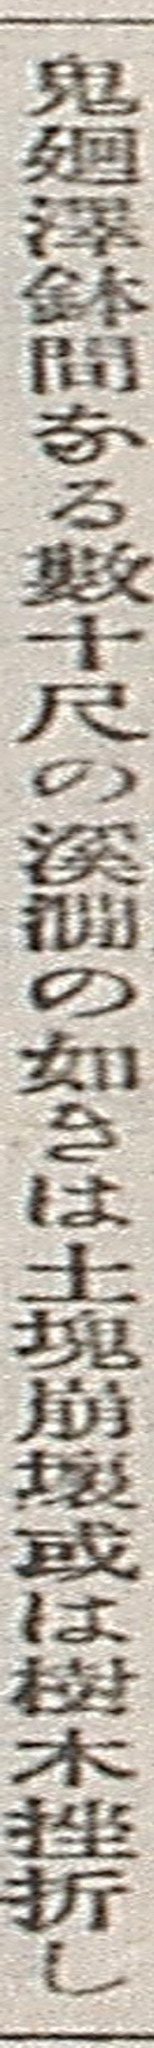鬼廻沢鉢間なる数十尺の渓間の如きは土塊崩壊或は樹木挫折し
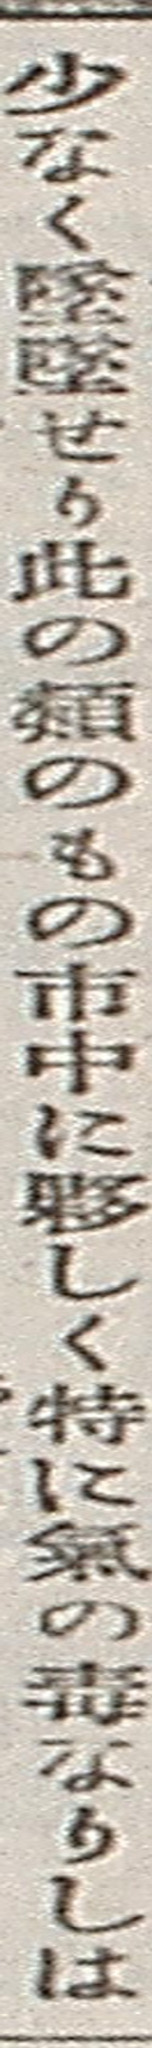少なく墜落せり此の類のもの市中に夥しく特に気の毒なりしは
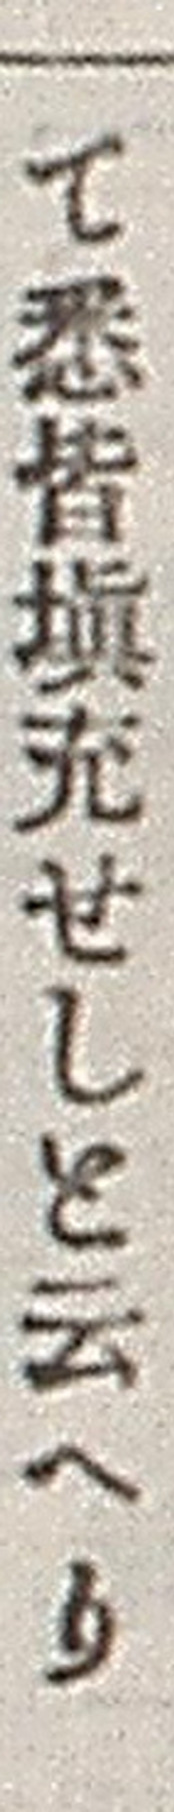て悉皆填充せしと云へり
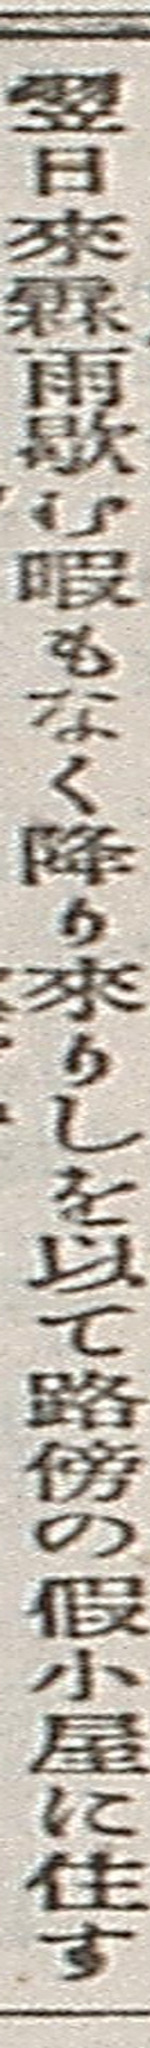翌日来霖雨歇む暇もなく降り来りしを以て路傍の仮小屋に住す
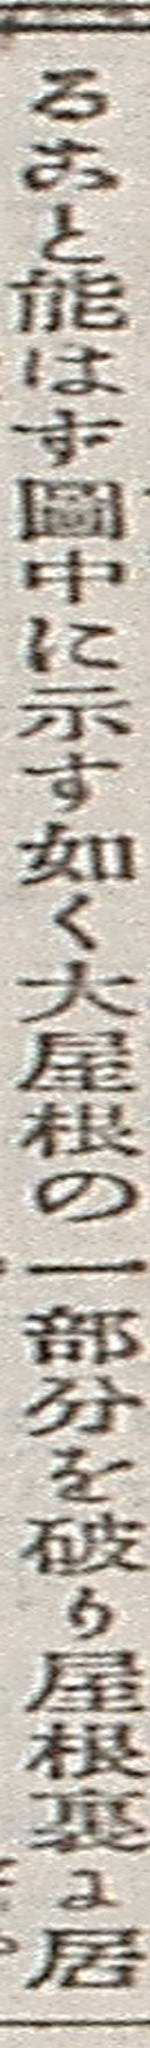ること能はず図中に示す如く大屋根の一部分を破り屋根裏に居
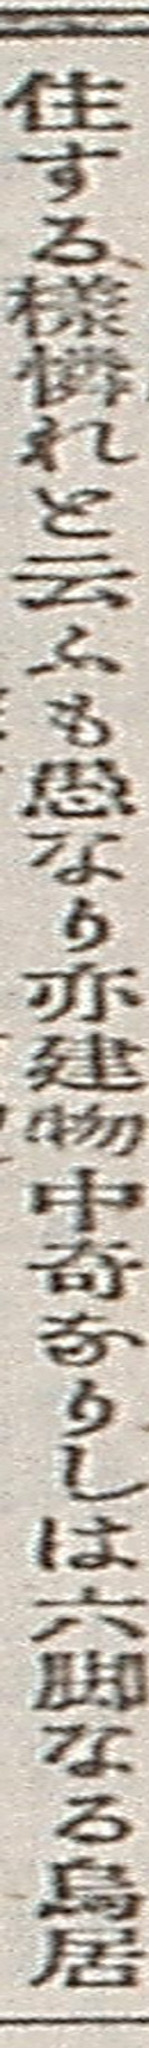住する様憐れと云ふも愚なり亦建物中奇なりしは六脚なる鳥居
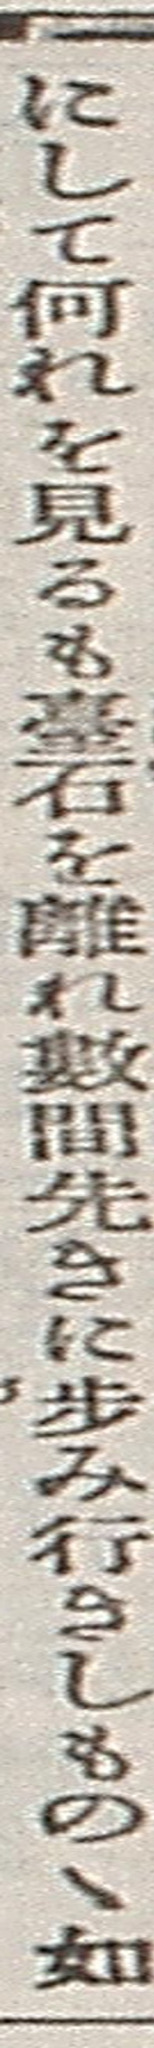にして何れを見るも台石を離れ数間先きに歩み行きしものゝ如
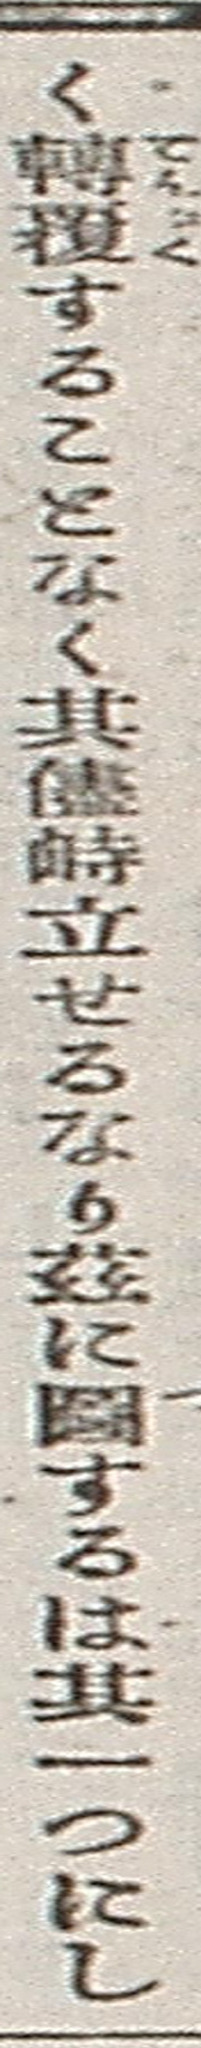く転覆することなく其侭峙立せるなり茲に図するは其一つにし
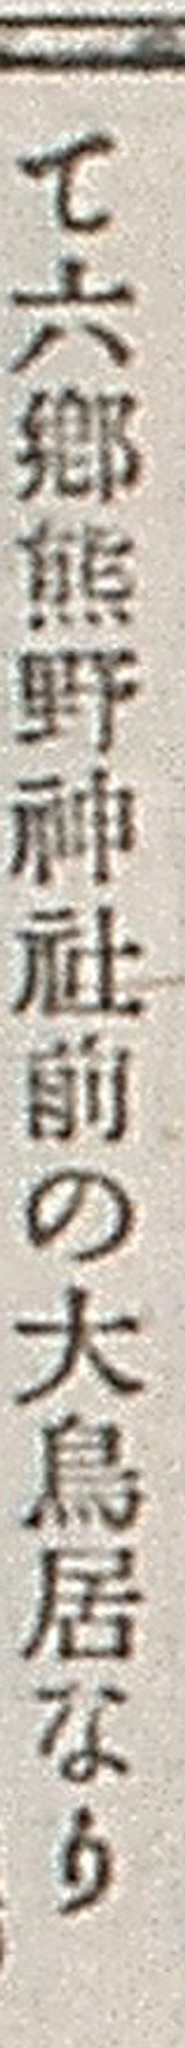て六郷熊野神社前の大鳥居なり
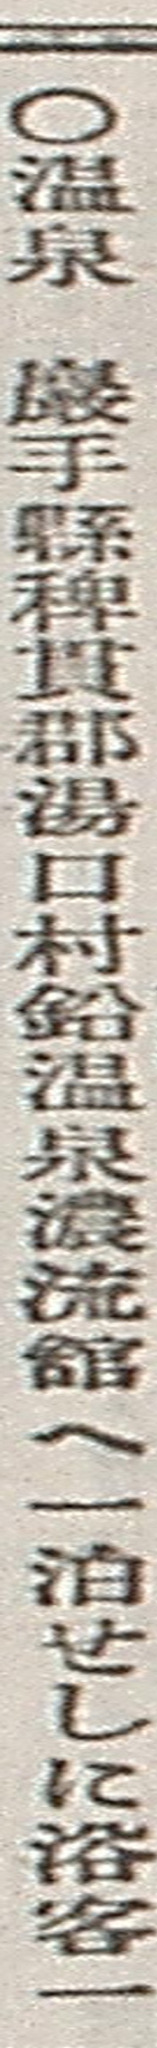〇温泉岩手県稗貫郡湯口村鉛温泉濃流舘へ一泊せしに浴客一

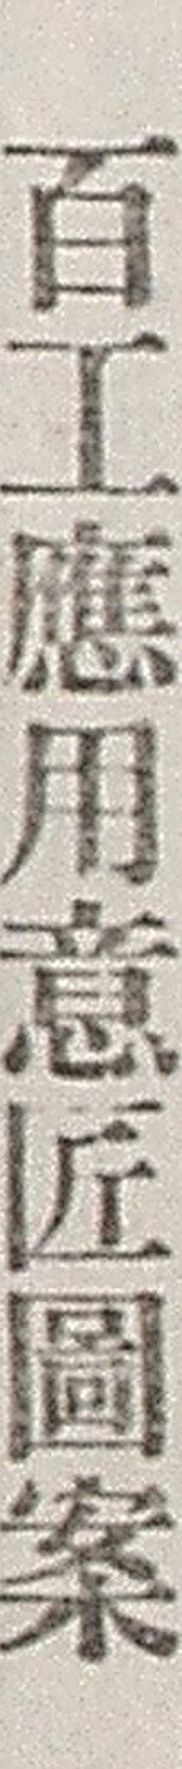百工応用意匠図案
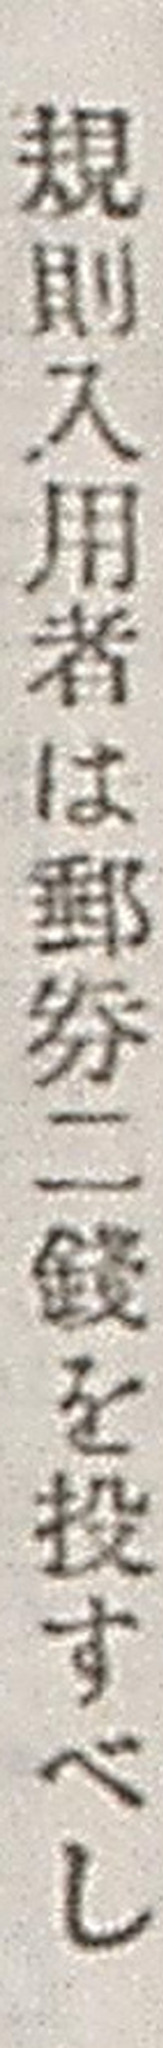規則入用者は郵券二銭を投すべし
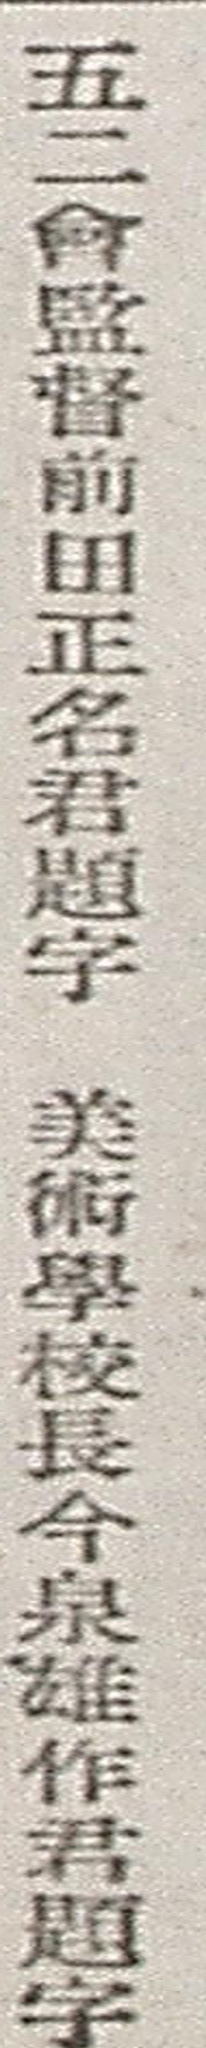五二会監督前田正名君題字美術学校長今泉雄作君題字
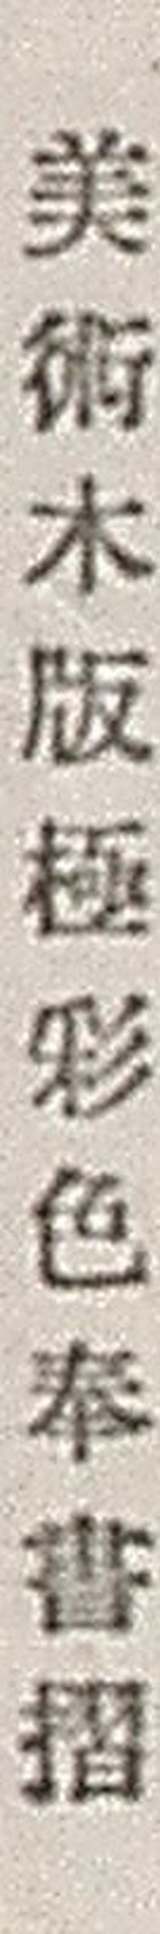美術木版極彩色奉書摺
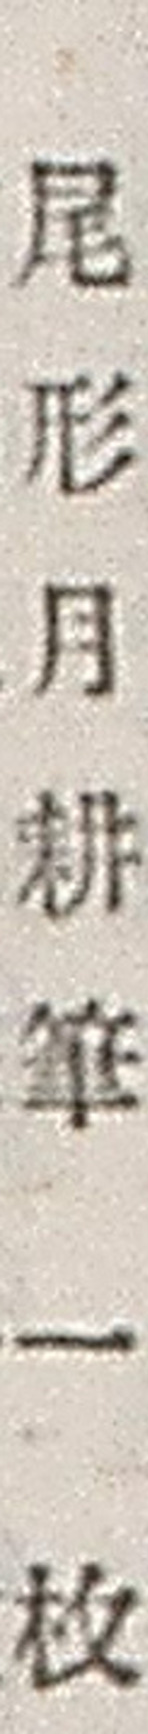尾形月耕筆一枚
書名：風俗畫報臨時増刊第百二十四號　洪水地震被害録（上）
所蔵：東京大学地震研究所図書室 Earthquake Research Institute Library, The University of Tokyo, JAPAN
